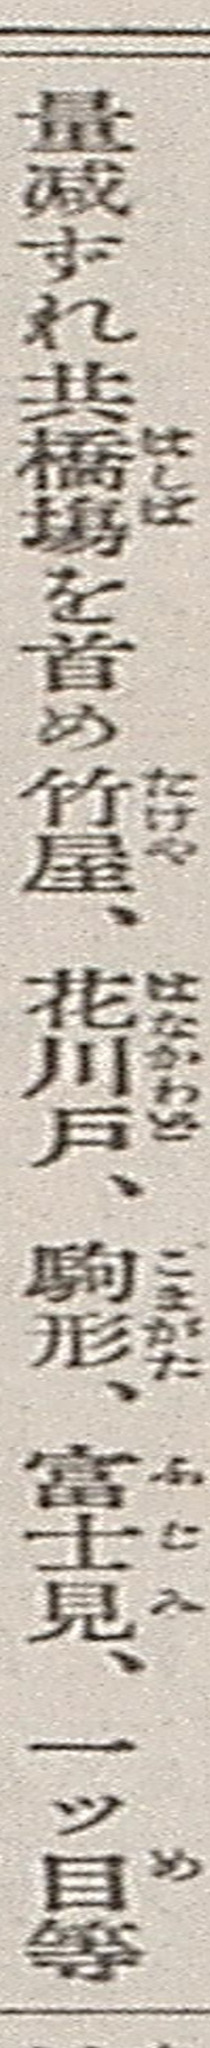量減ずれ共橋場を首め竹屋、花川戸、駒形、富士見、一ツ目等
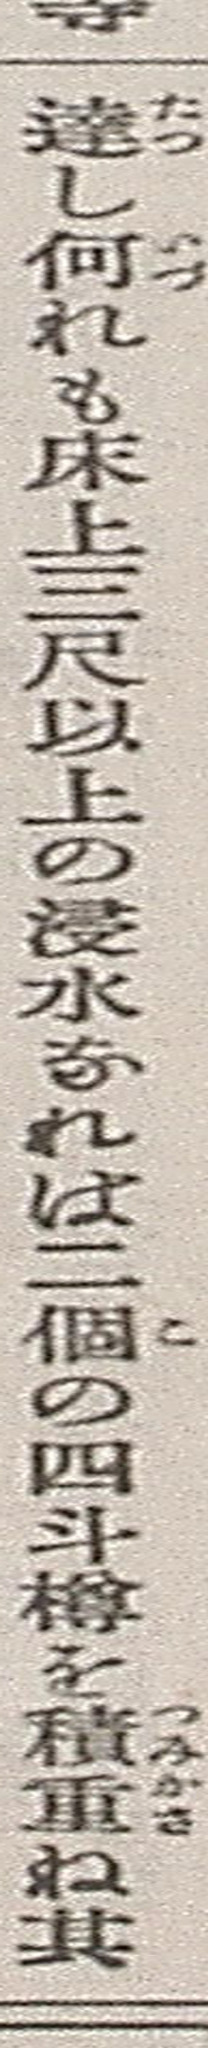達し何れも床上三尺以上の浸水なれば二個の四斗樽を積重ね其
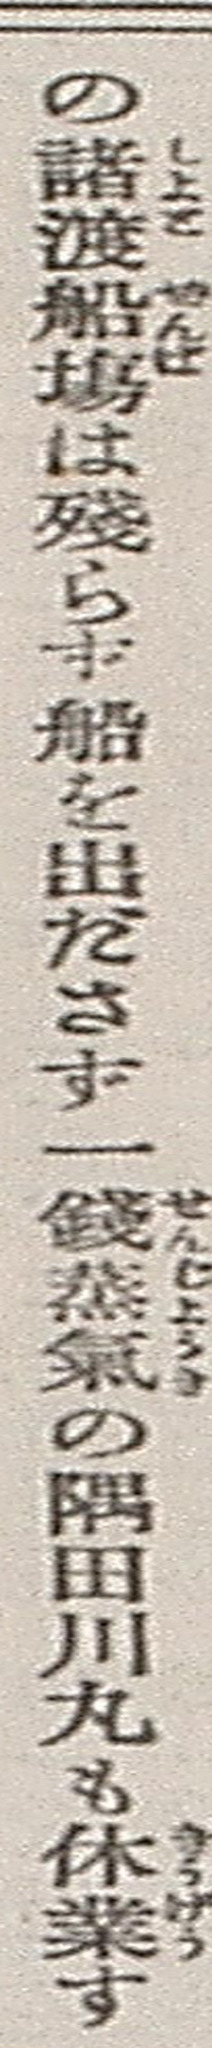の諸渡船場は残らず船を出ださず一銭蒸気の隅田川丸も休業す
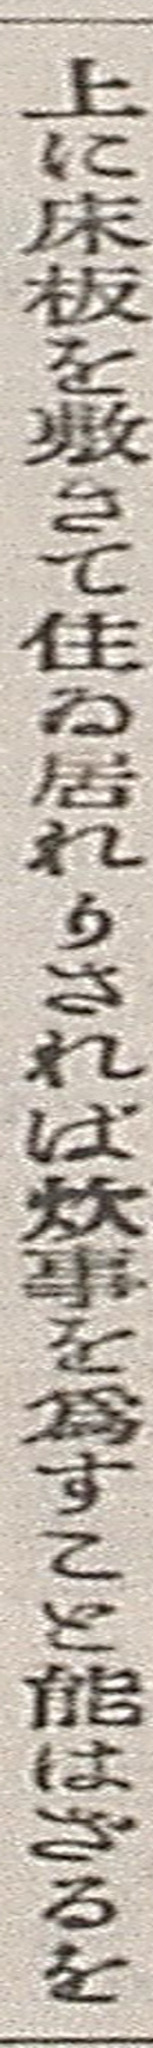上に床板を敷きて住ゐ居れりされば炊事を為すこと能はざるを
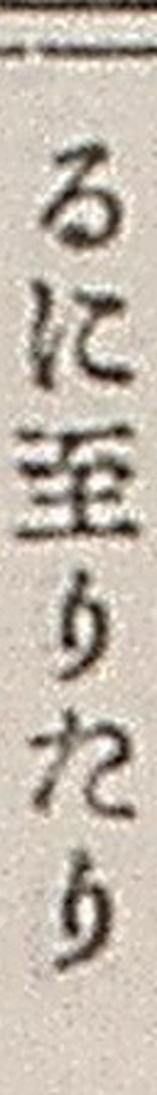るに至りたり
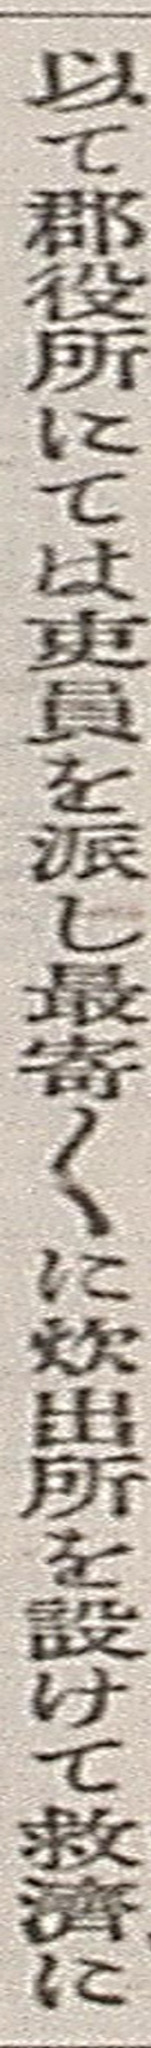以て郡役所にては吏員を派し最寄〳〵に炊出所を設けて救済に
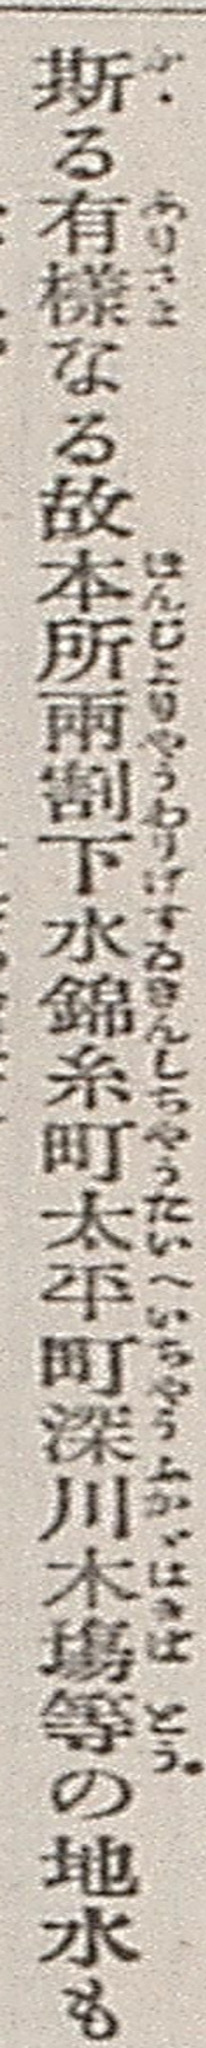斯る有様なる故本所両割下水錦糸町太平町深川木場等の地水も
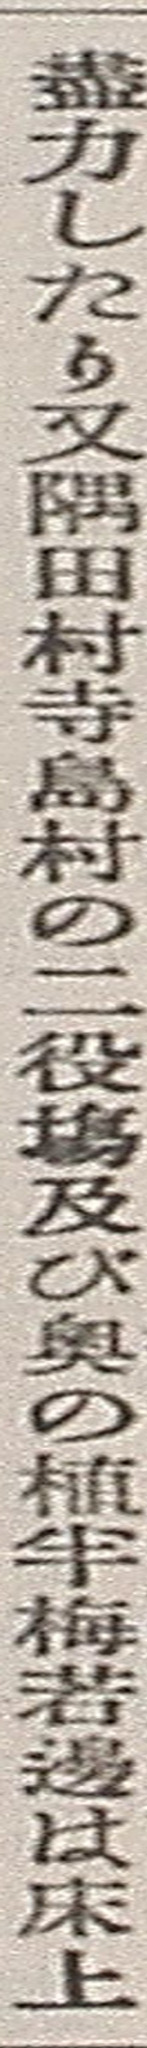尽力したり又隅田川村寺島村のニ役場及び奥の植半梅若辺は床上
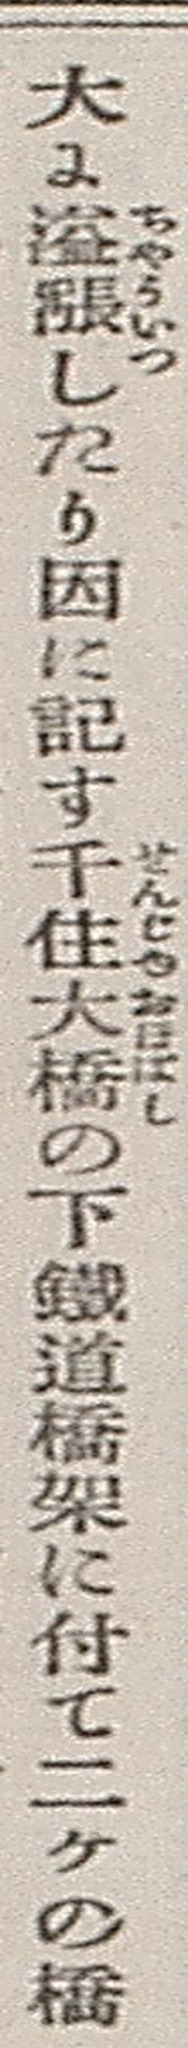大に溢漲したり因に記す千住大橋の下鉄道橋架に付てニケの橋
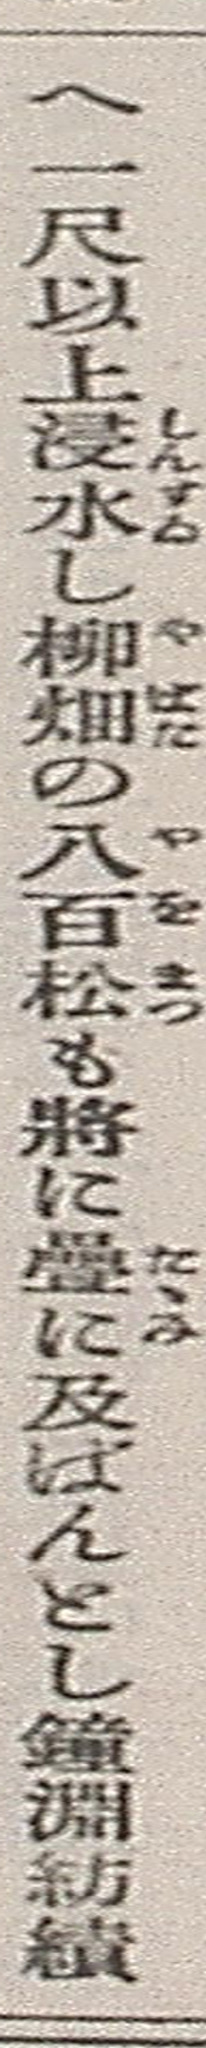へ一尺以上浸水し柳田の八百松も将に畳に及ばんとし鐘淵紡績
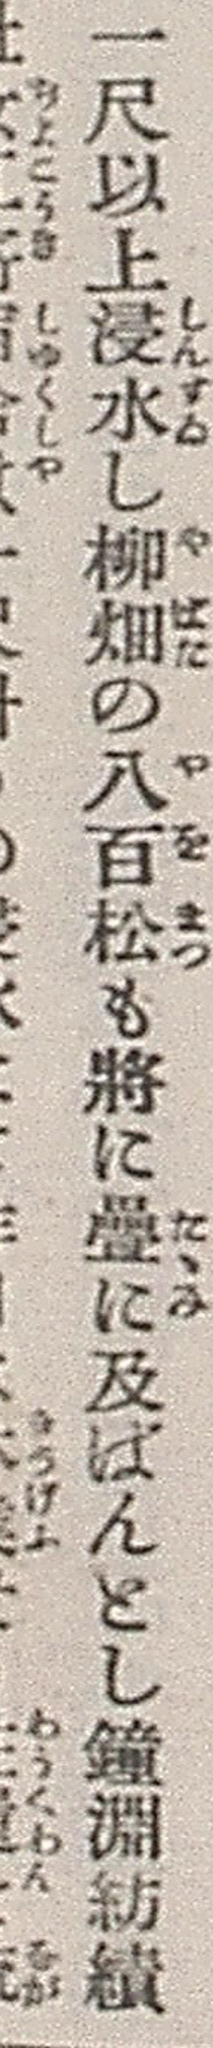へ一尺以上浸水し柳田の八百松も将に畳に及ばんとし鐘淵紡績

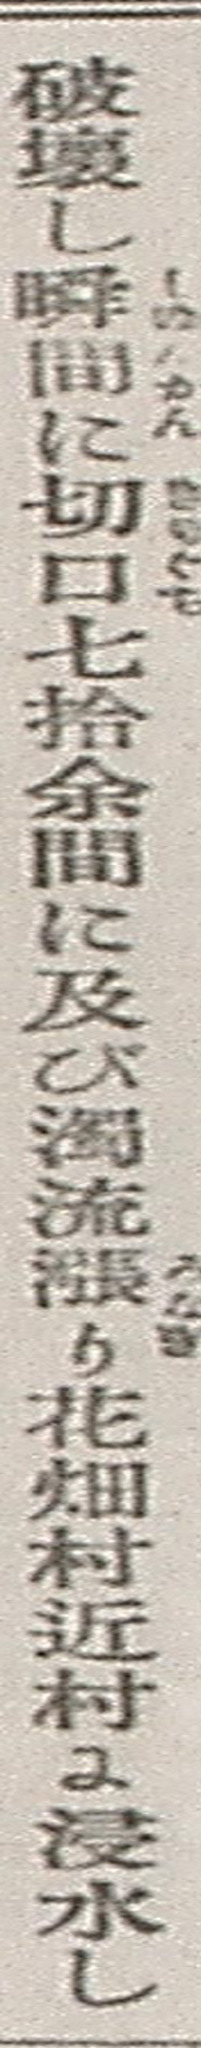破壊し瞬間に切口七拾余間に及び濁流漲り花畑村に浸水し
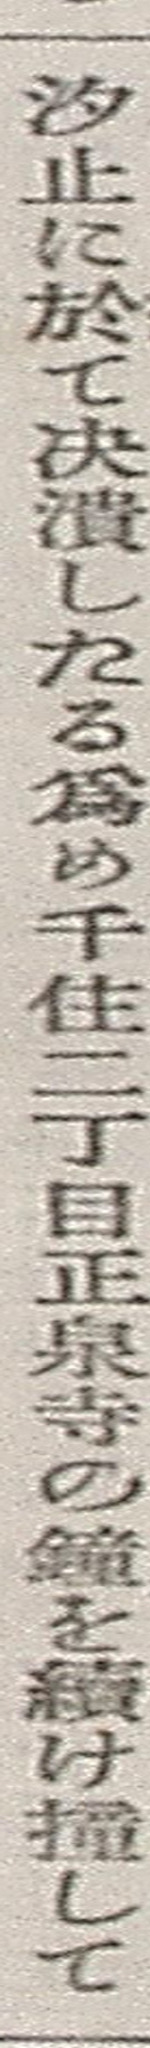汐止に於て決潰したる為め千住二丁目正泉寺の鐘を続け撞して
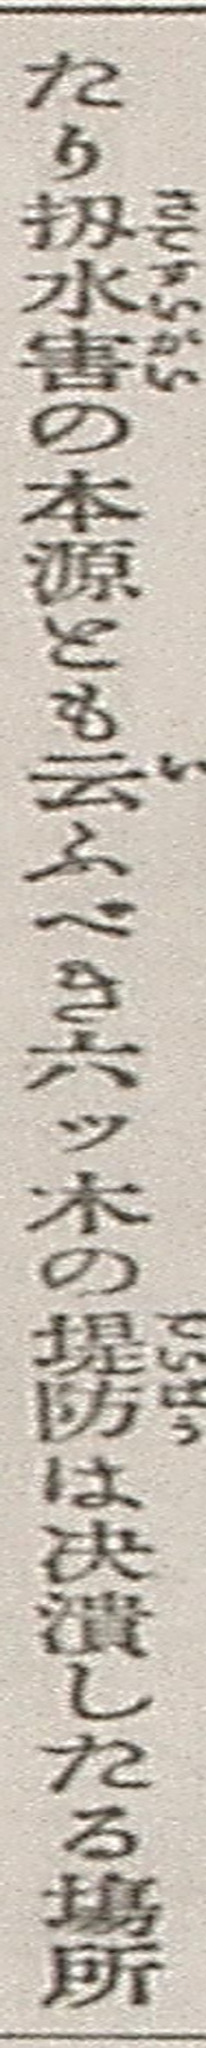たり扨水害の本源とも云ふべき六ツ木の堤防は決潰したる場所
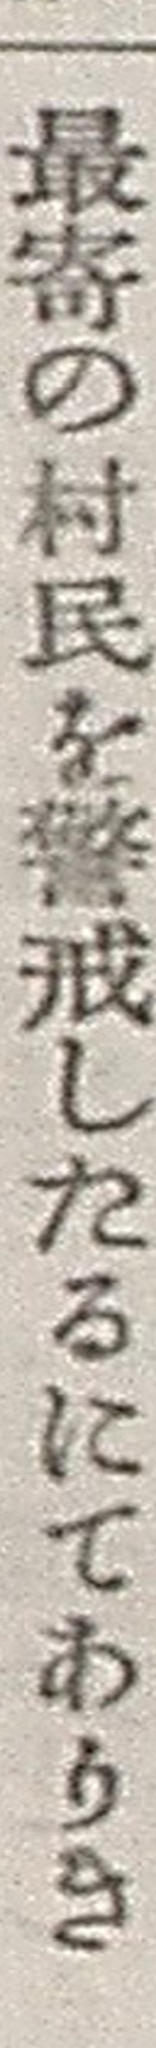最寄の村民を警戒したるにてありき
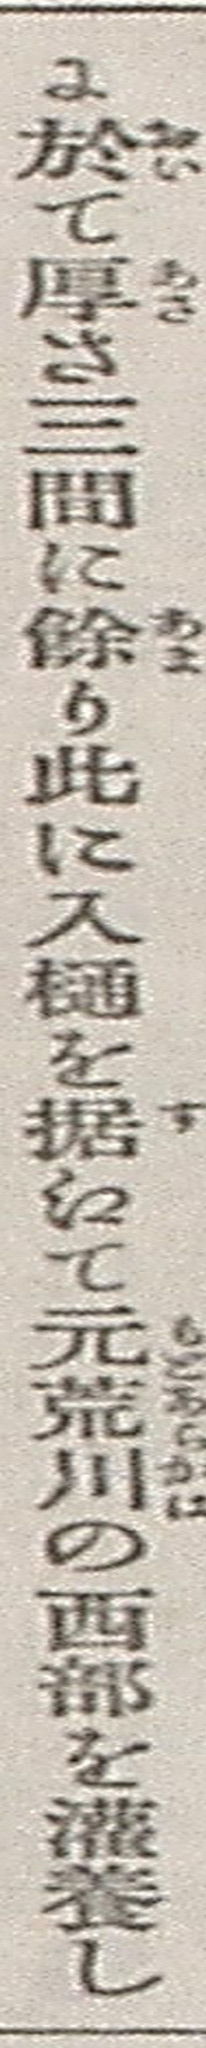に於て厚さ三間に余り此に入樋を据えて元荒川の西部を灌養し
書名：風俗畫報臨時増刊第百二十四號　洪水地震被害録（上）
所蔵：東京大学地震研究所図書室 Earthquake Research Institute Library, The University of Tokyo, JAPAN
